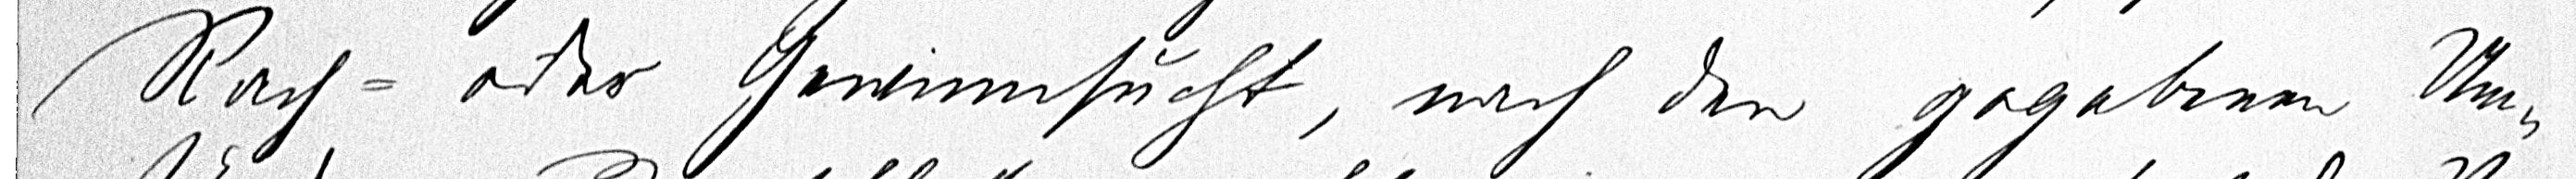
Rach- oder Gewinnsucht, nach den gegebenen Um¬
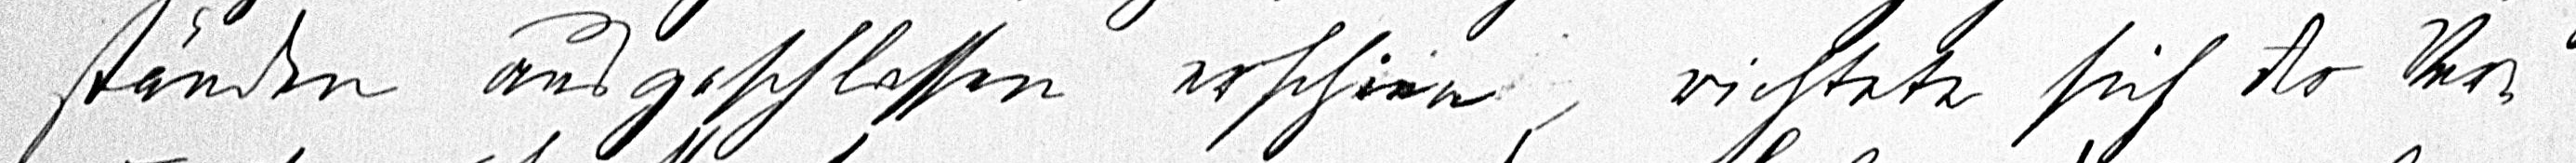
ständen ausgeschlossen erschien, richtete sich der Ver¬
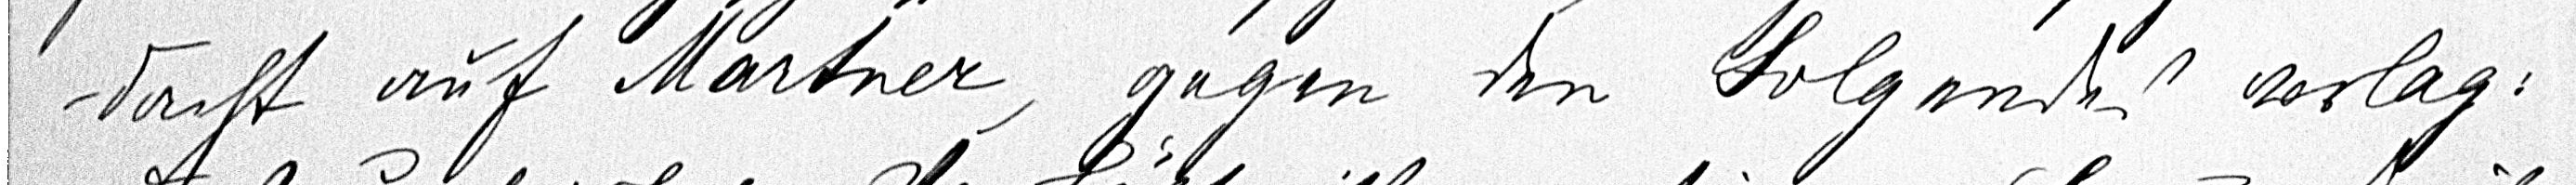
dacht auf Martner, gegen den Folgendes verlag:
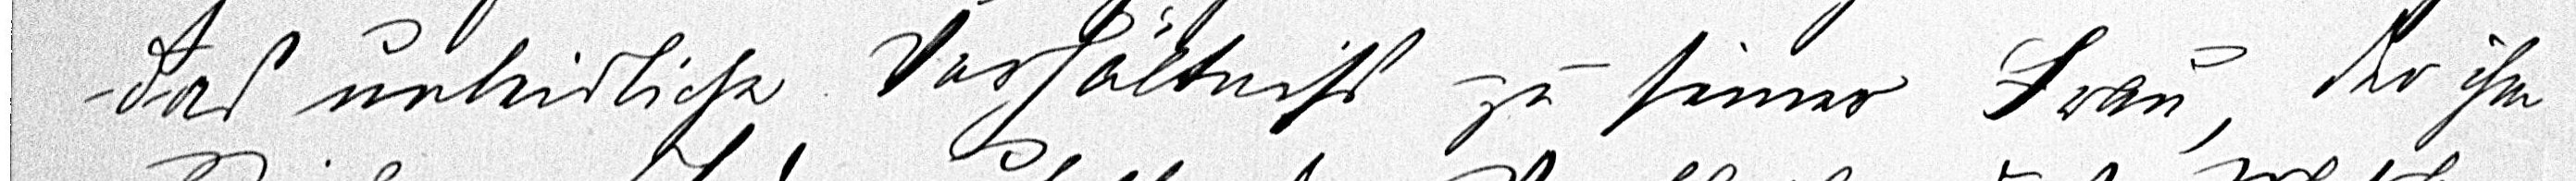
das unleidliche Verhältniss zu seiner Frau, der ihm
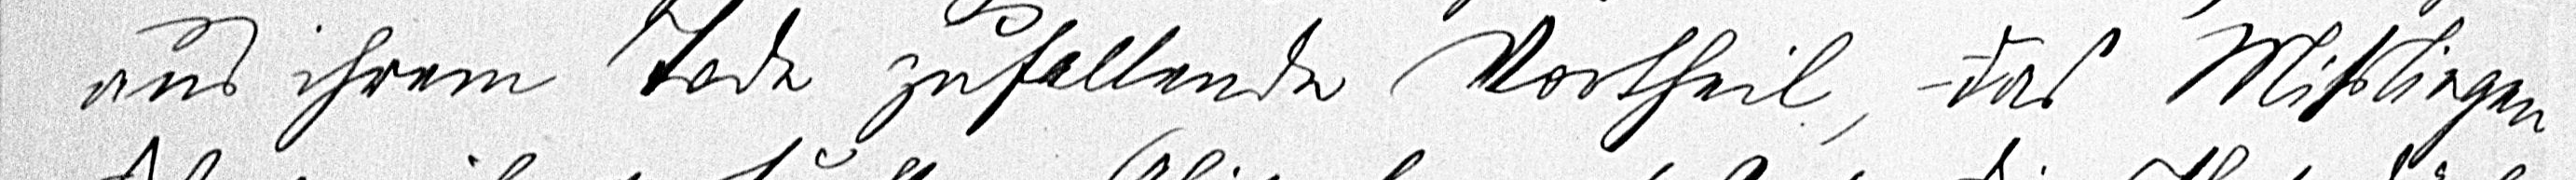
aus ihrem Tode zufallende Vortheil, das Misslingen¬
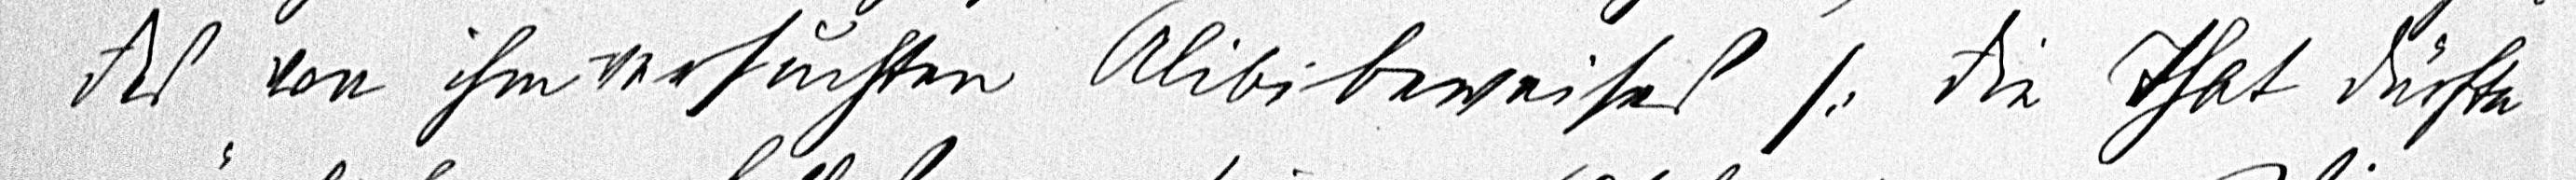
des von ihm versuchten Alibibeweises /:Die That dürfte
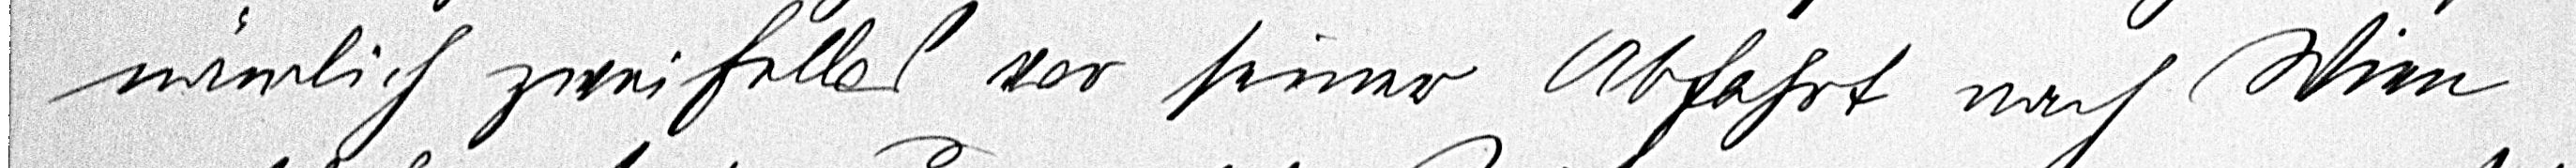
nämlich zweifalles vor seiner Abfahrt nach Wien
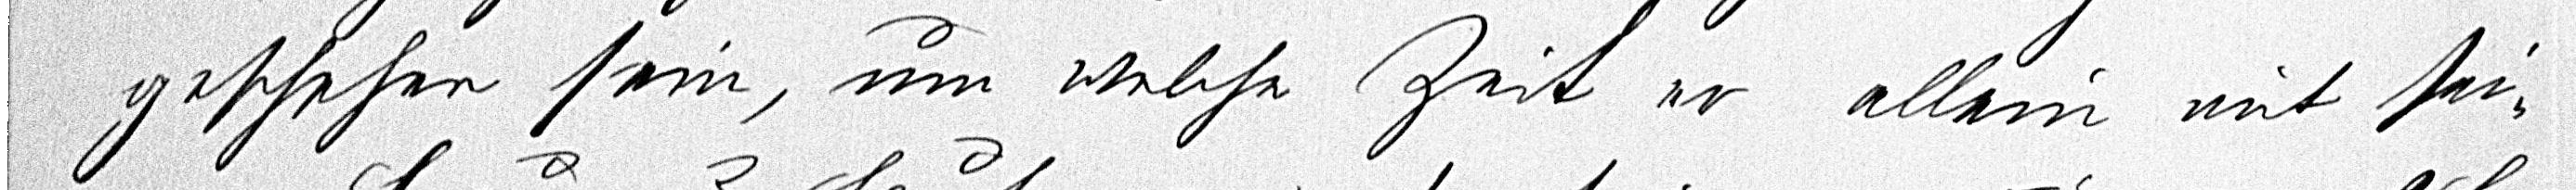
geschehen sein, um welche Zeit er allein mit sei¬
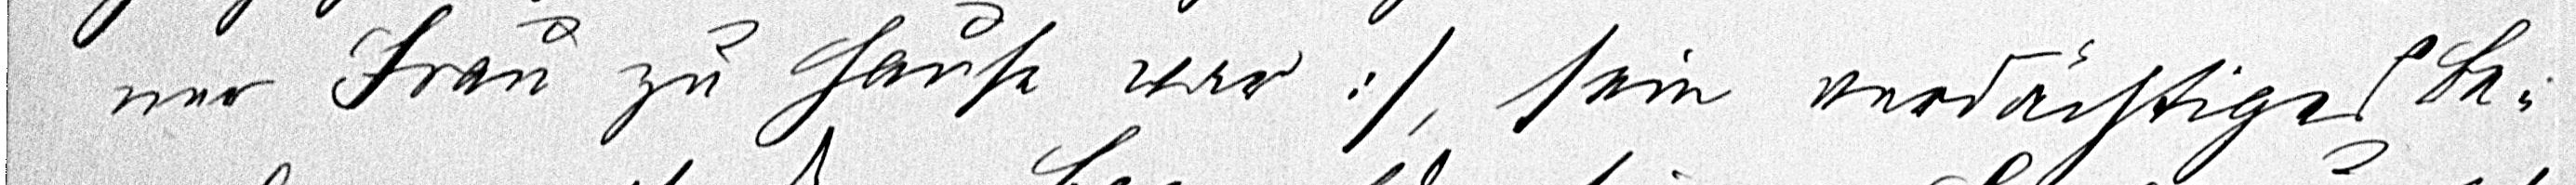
ner Frau zu Hause war:/, sein verdächtiges Be¬
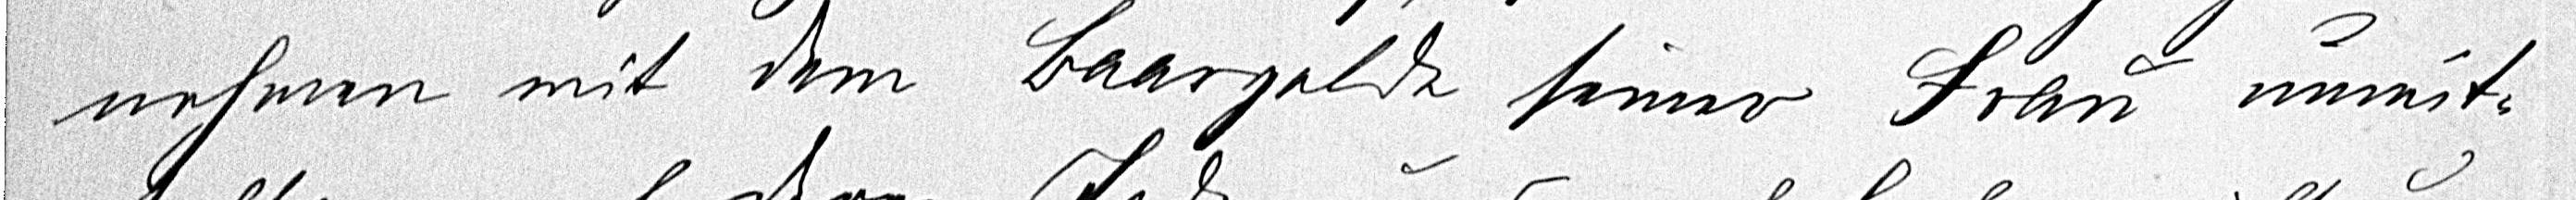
nehmen mit dem Baargelde seiner Frau unmit¬
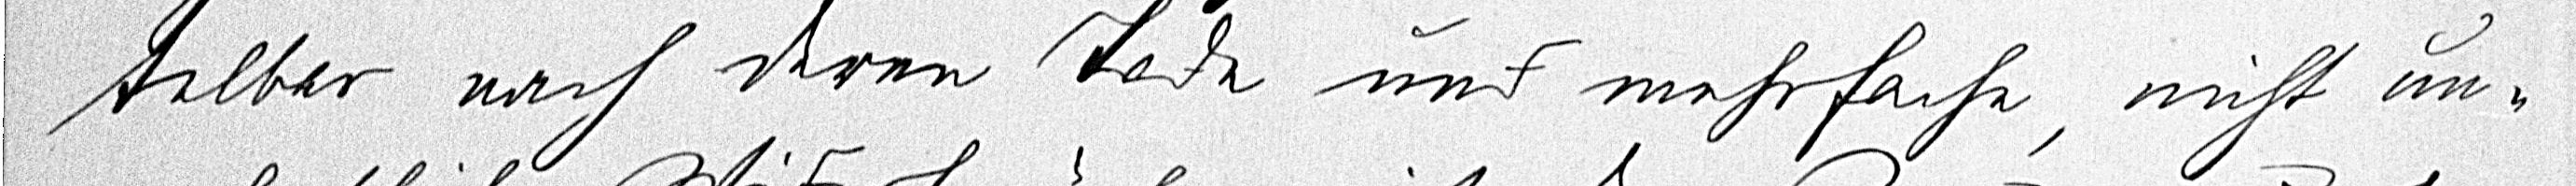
telbar nach deren Tode und mehrfache, nicht un¬
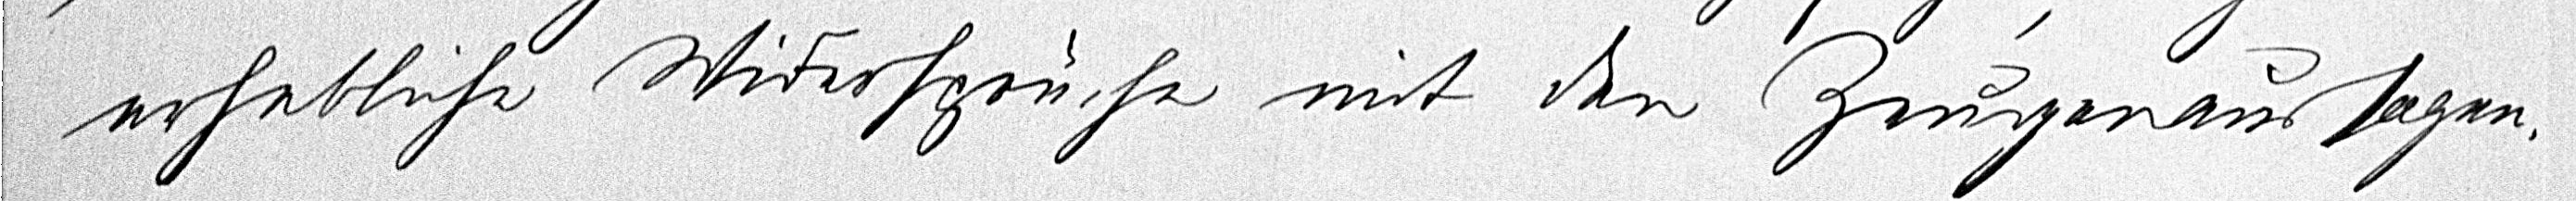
erhebliche Widersprüche mit den Zeugenaussagen.
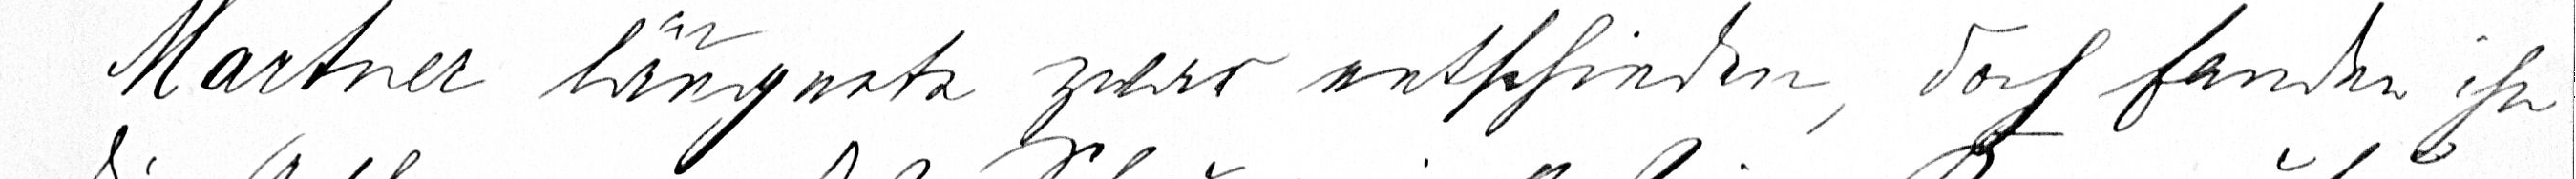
Martner läugnete zwar entschieden, doch fanden ihn
